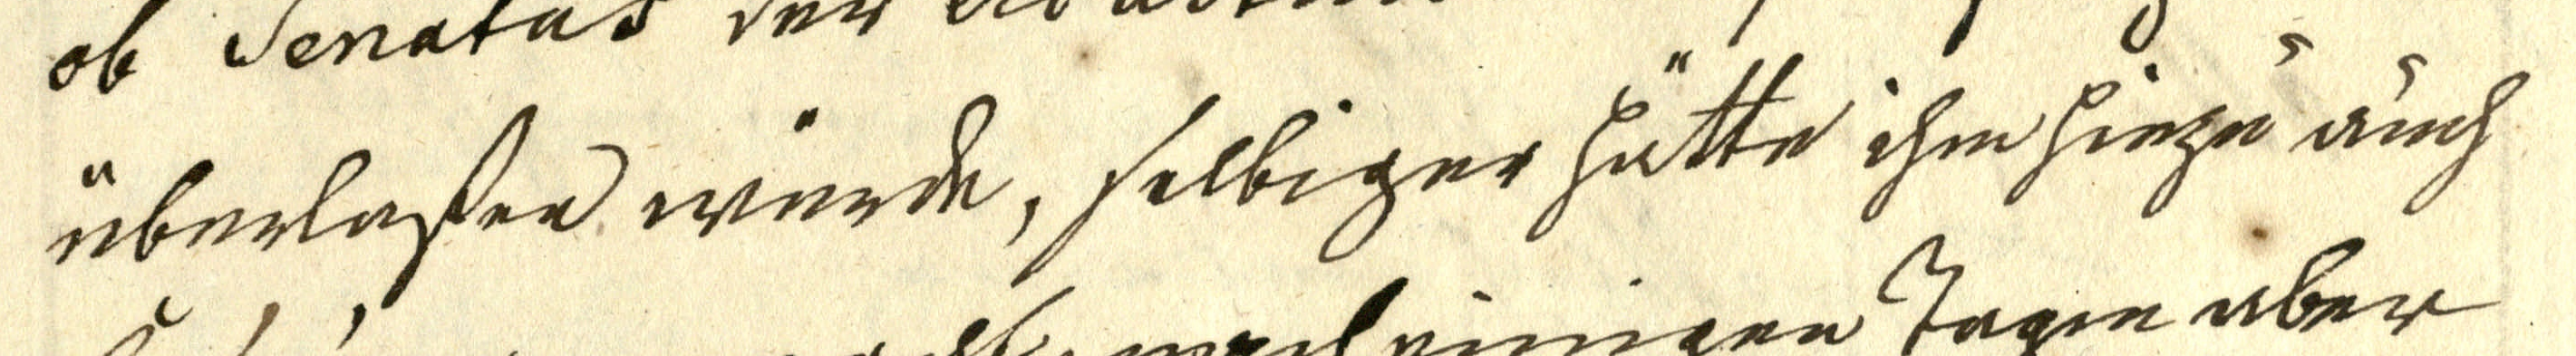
überlaßen würde, selbiger hätte ihm hiezu auch
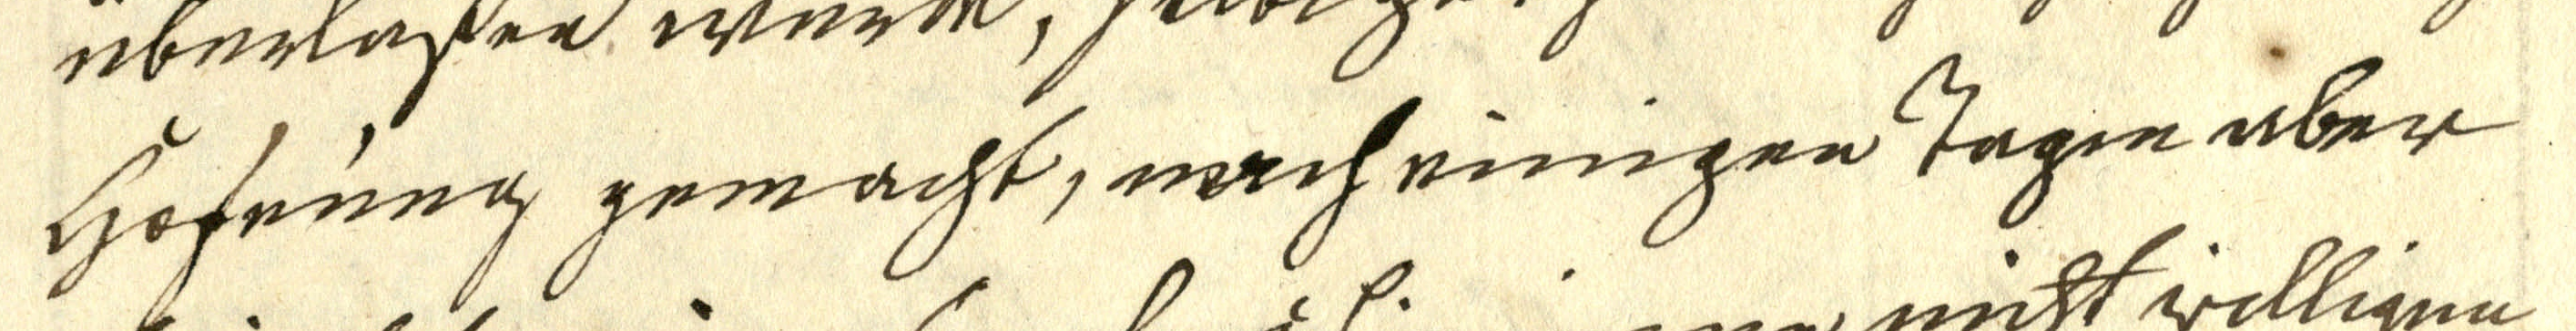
Hofnung gemacht, nach einigen Tagen aber
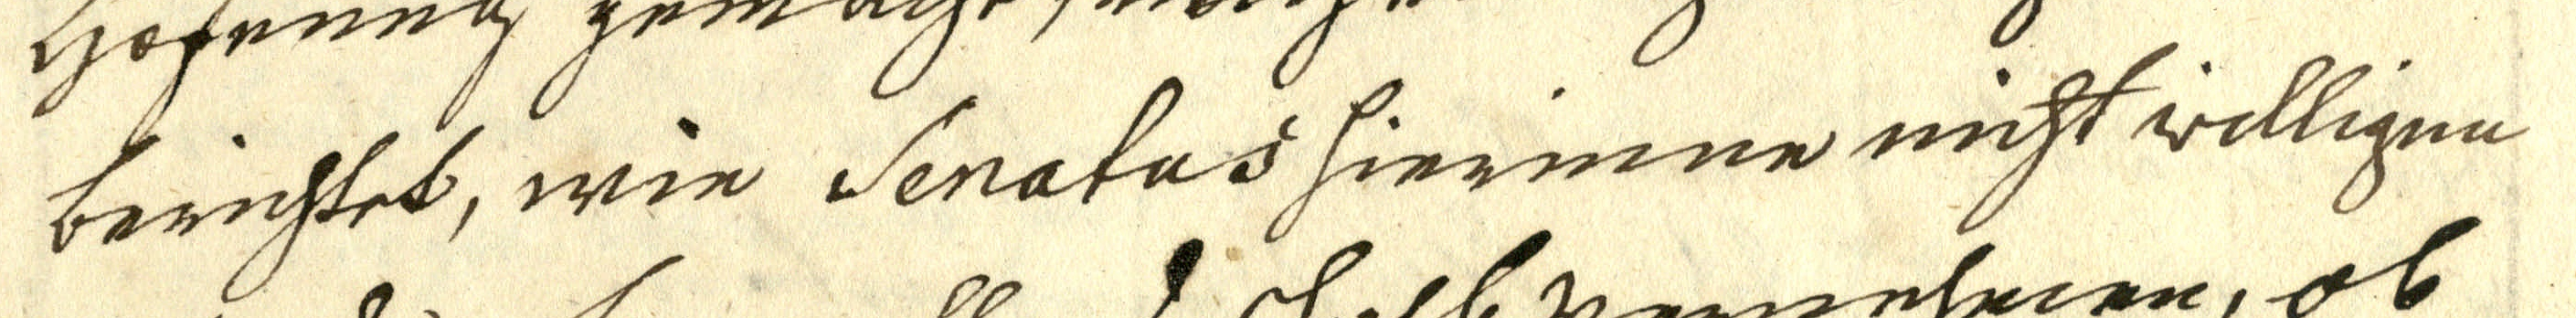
berichtet, wie Senatus hierinne nicht willigen
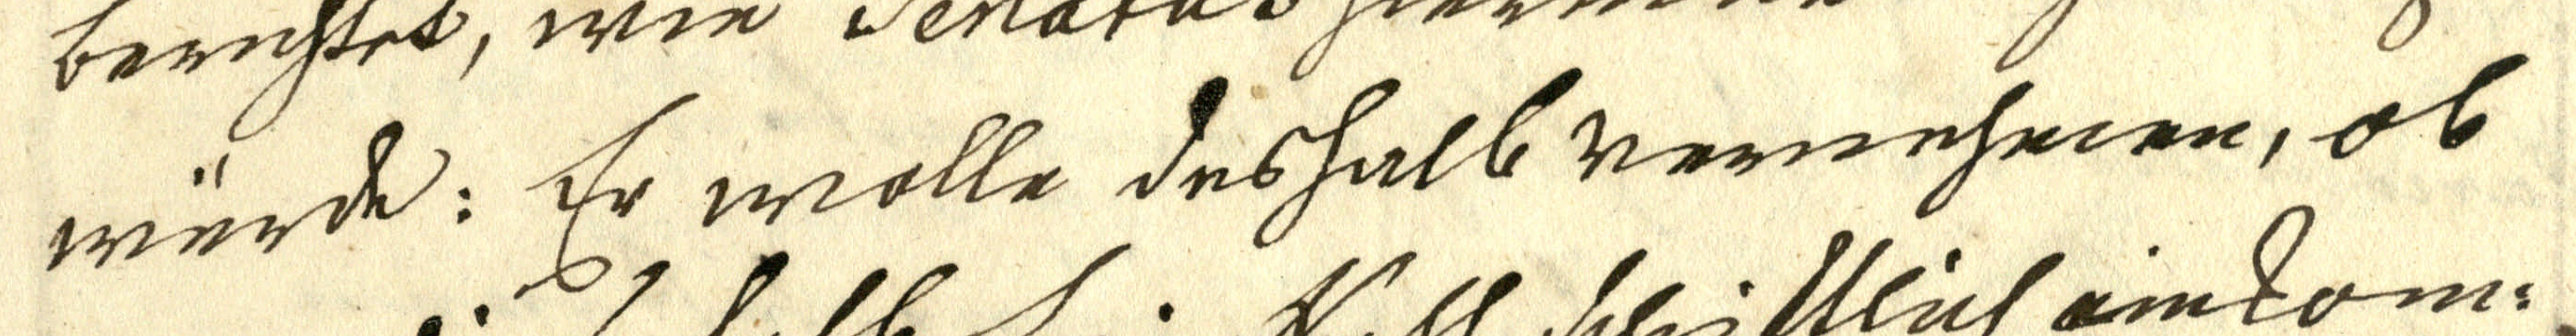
würde. Er wolle deshalb vernehmen, ob
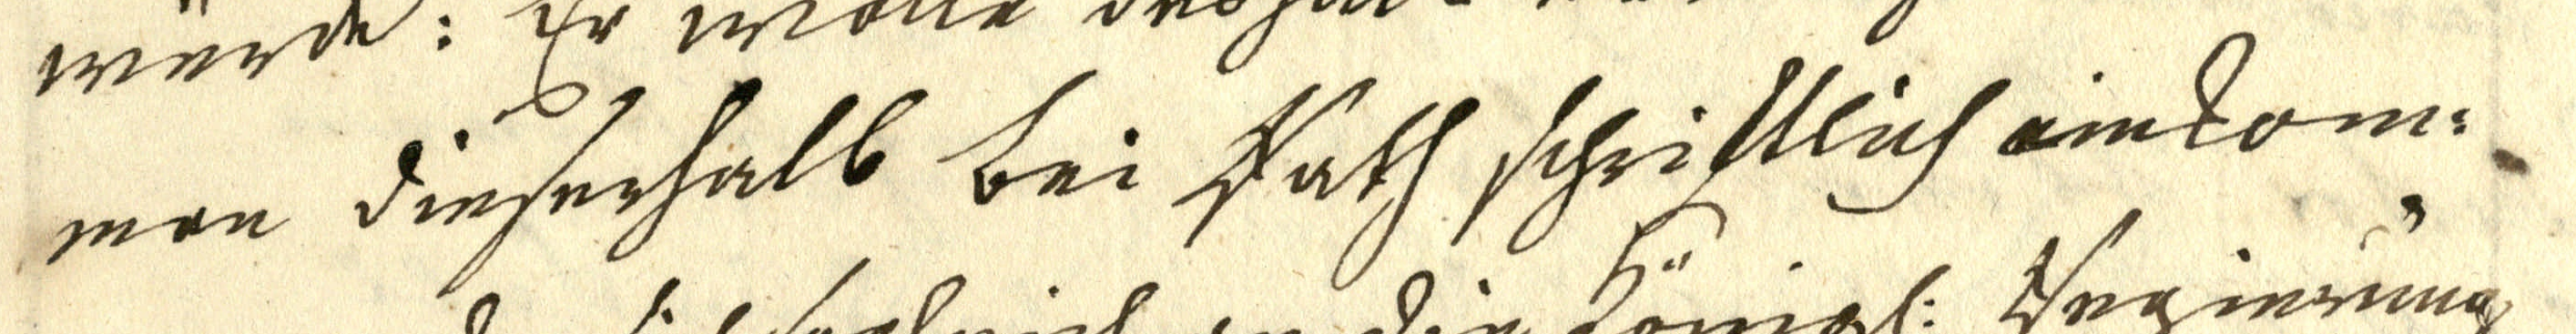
man dieserhalb bei Rath schriftlich einkom¬
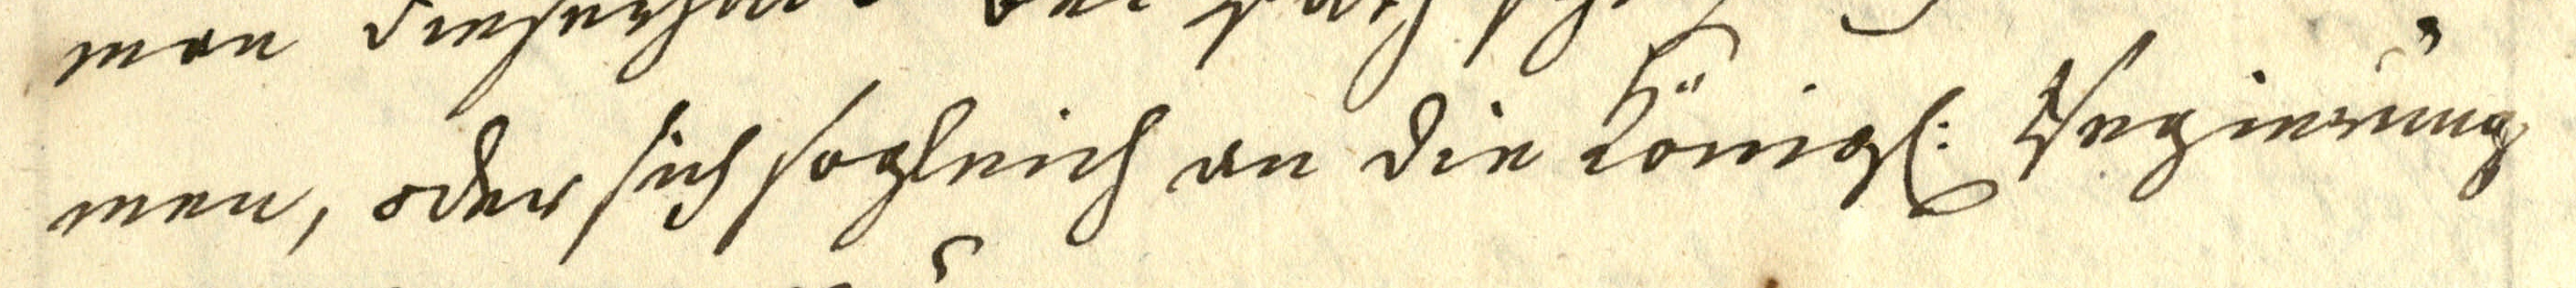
men, oder sich sogleich an die Königl. Regierung
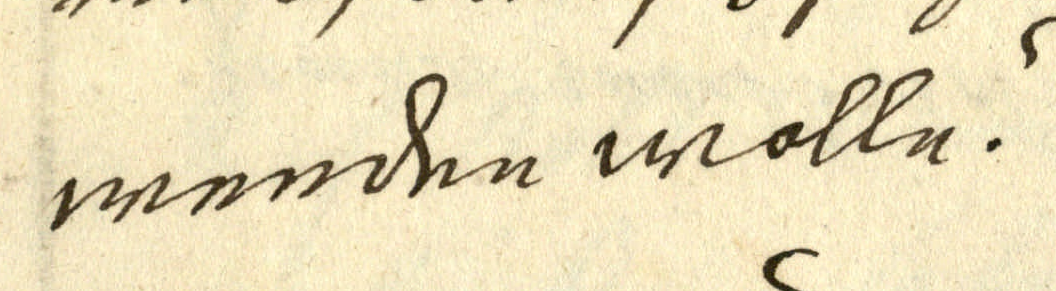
wenden wolle?
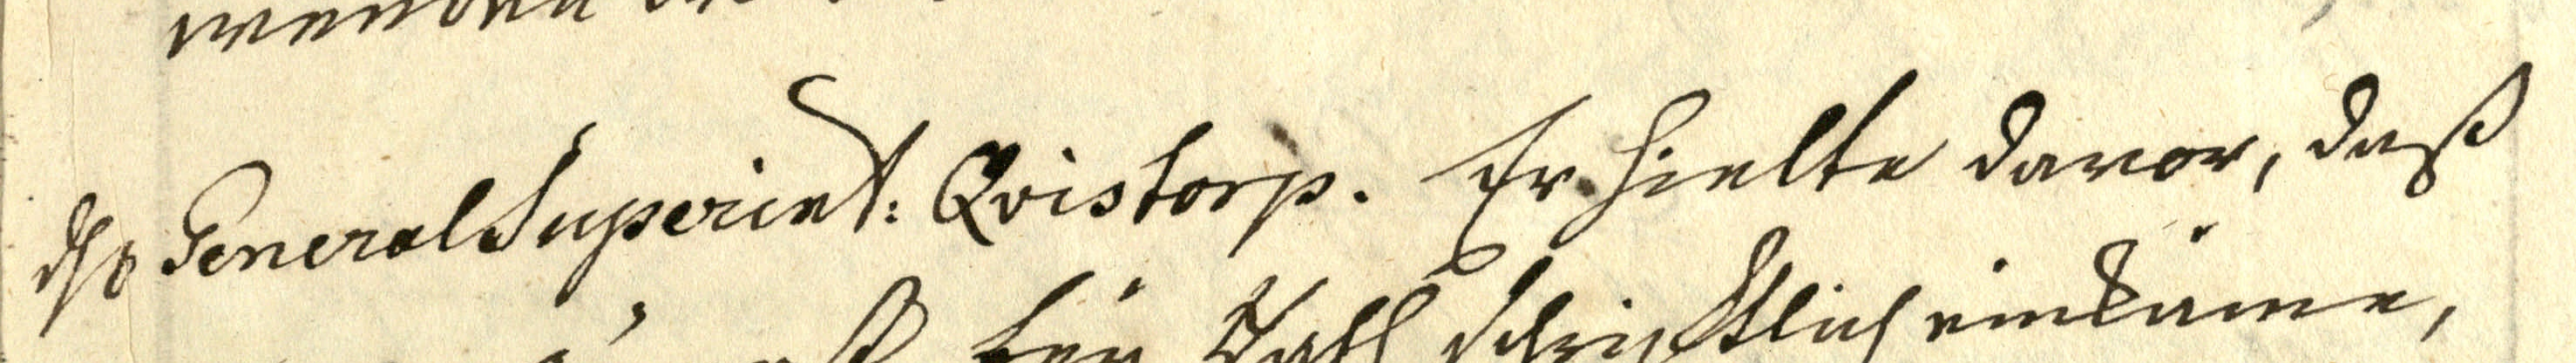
dh GeneralSuperint. Quistorp. Er hielte davor, daß
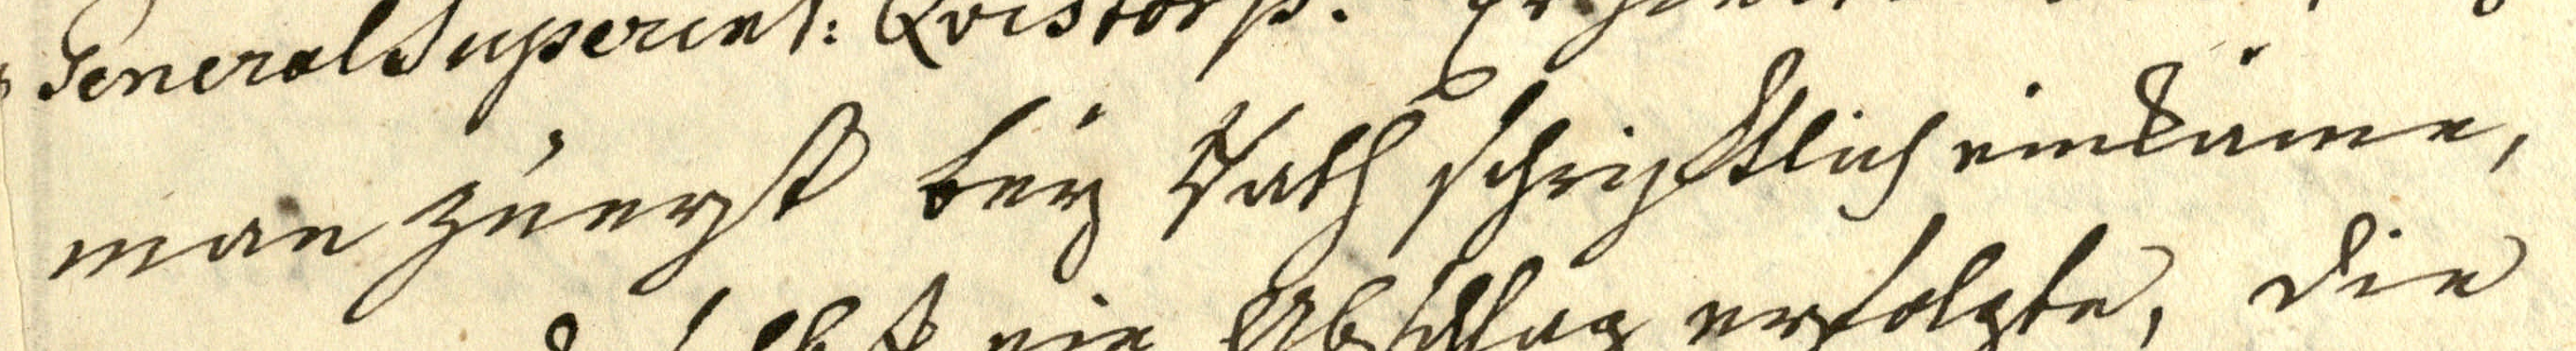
man zuerst beÿ Rath schriftlich einkäme,
